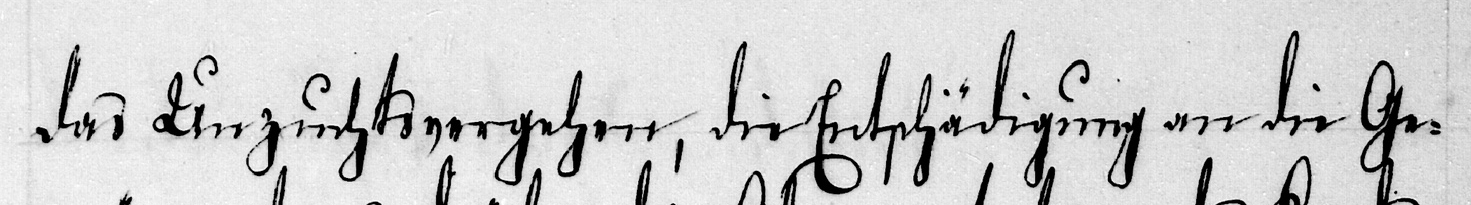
das Unzuchtsvergehen, die Entschädigung an die Ge¬
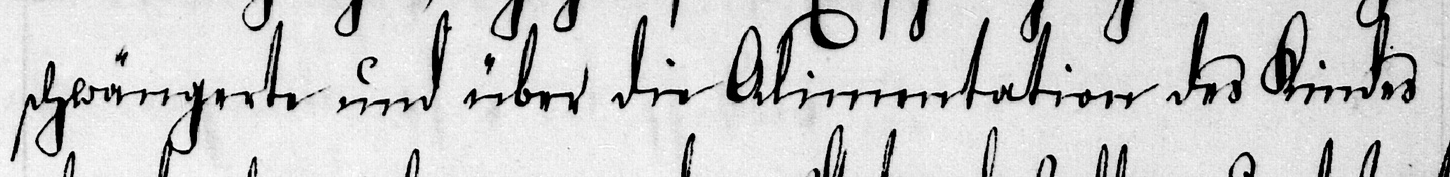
schwängerte und über die Alimentation des Kindes
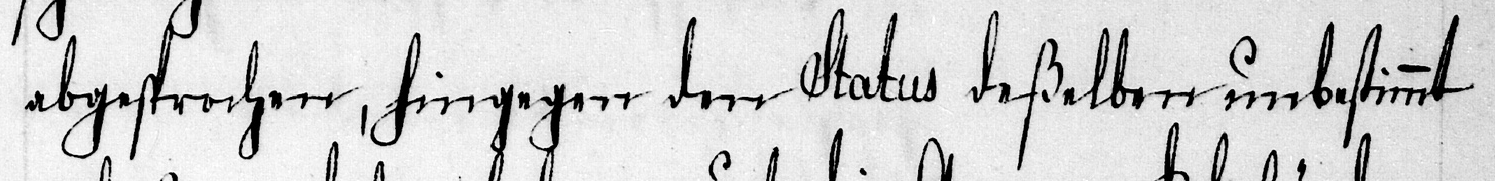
abgesprochen, hingegen den Status deßelben unbestimmt
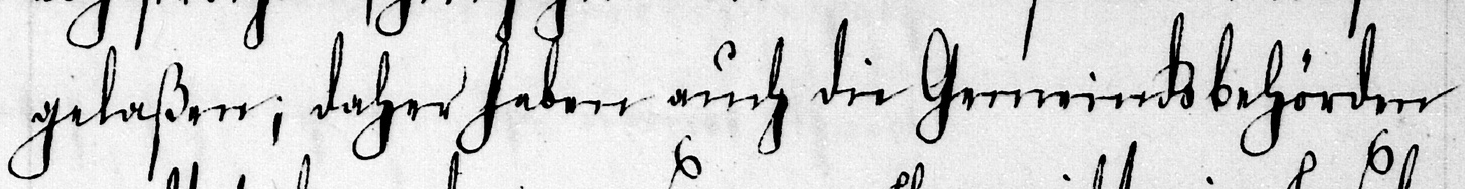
gelaßen; daher haben auch die Gemeindsbehörden
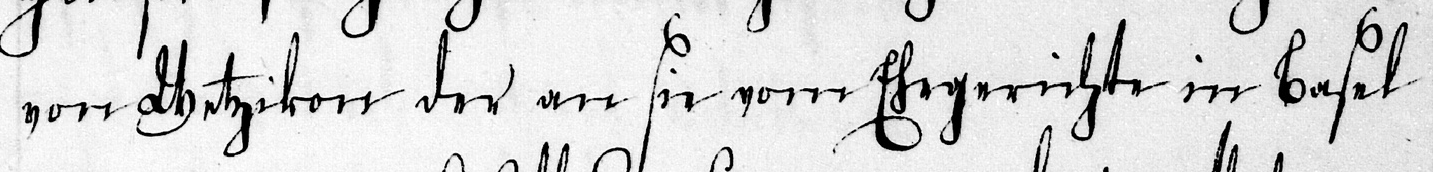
von Wetzikon der an sie vom Ehegerichte in Basel
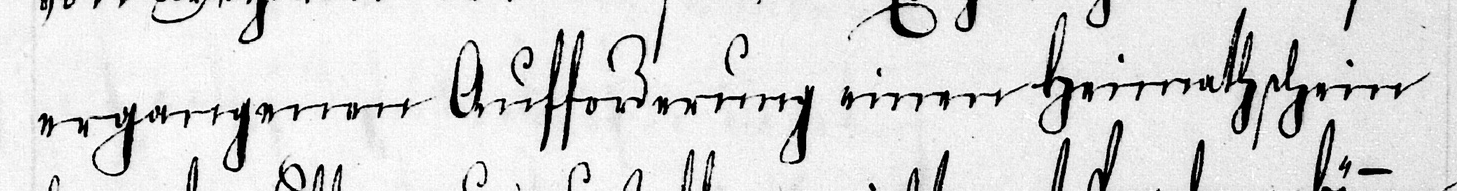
ergangenen Aufforderung einen Heimathschein
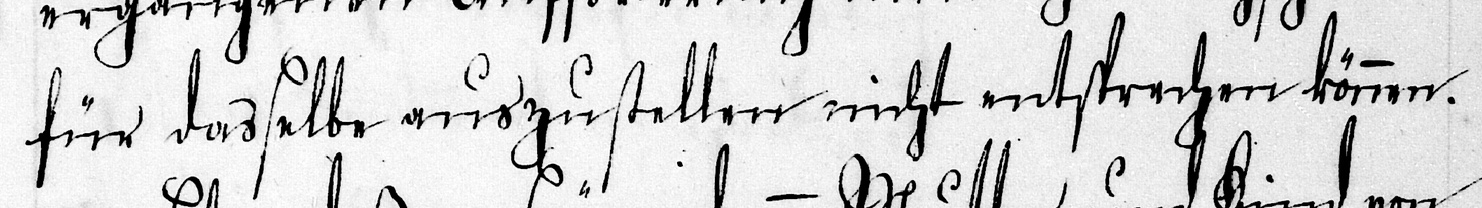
für dasselbe auszustellen nicht entsprechen können.
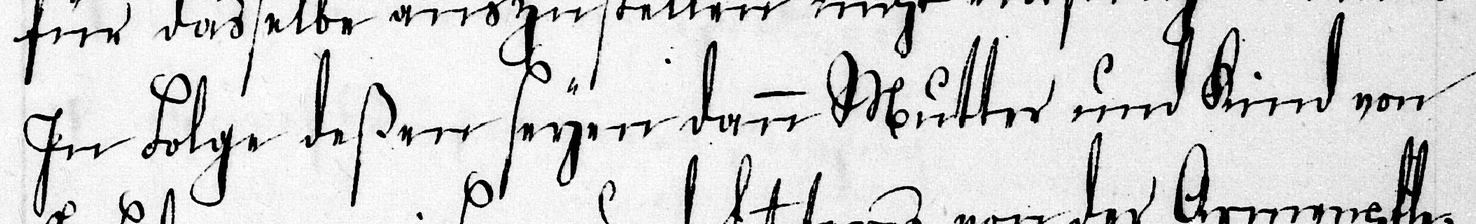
In Folge deßen seyen dann Mutter und Kind von
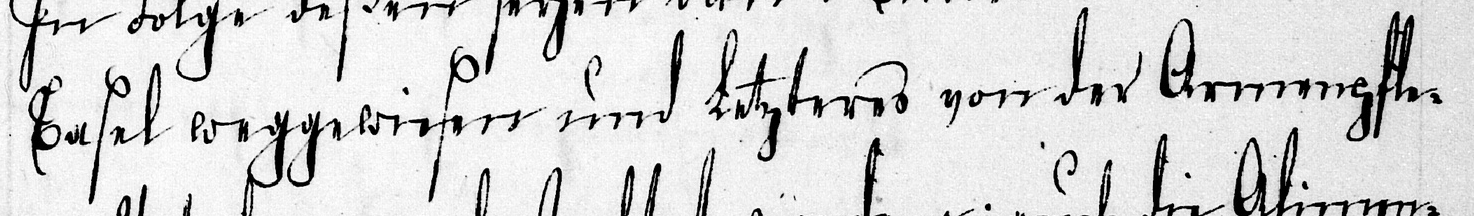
Basel weggewiesen und Letzteres von der Armenpfle¬
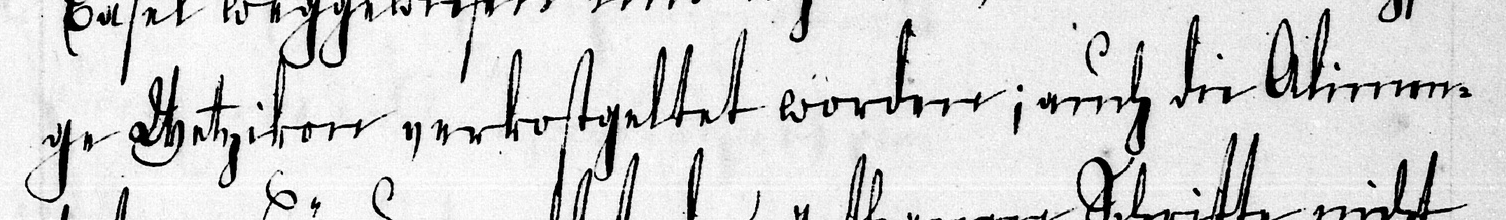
ge Wetzikon verkostgeltet worden; auch die Alimen¬
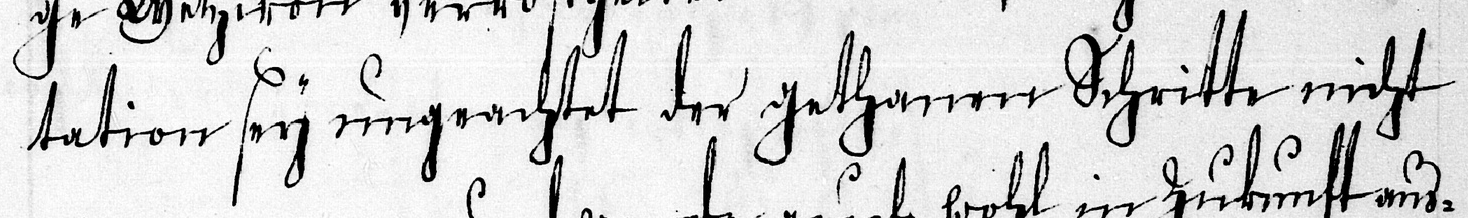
tation sey ungeachtet der gethanen Schritte nicht
